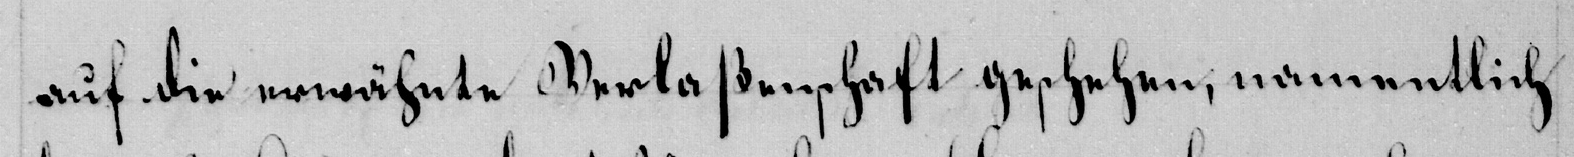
auf die erwähnte Verlaßenschaft geschehen, namentlich
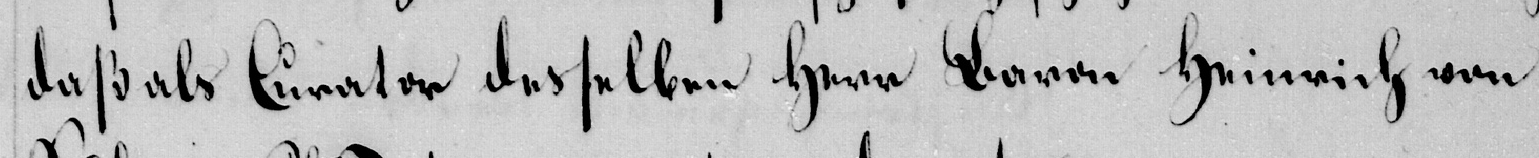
daß als Curator desselben Herr Baron Heinrich von
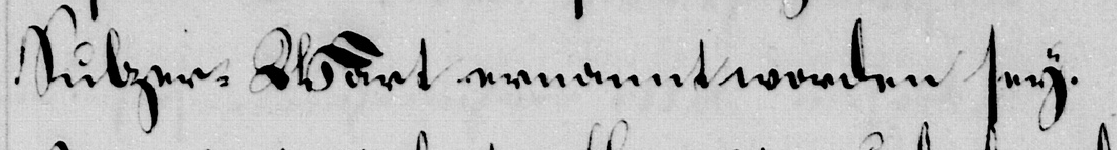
Sulzer-Wart ernannt worden sey.
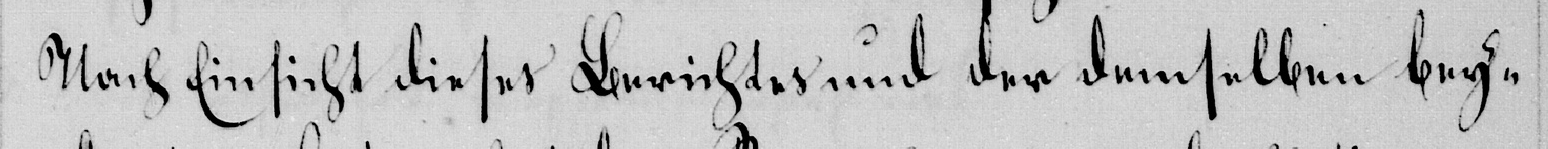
Nach Einsicht dieses Berichtes und der demselben bey¬
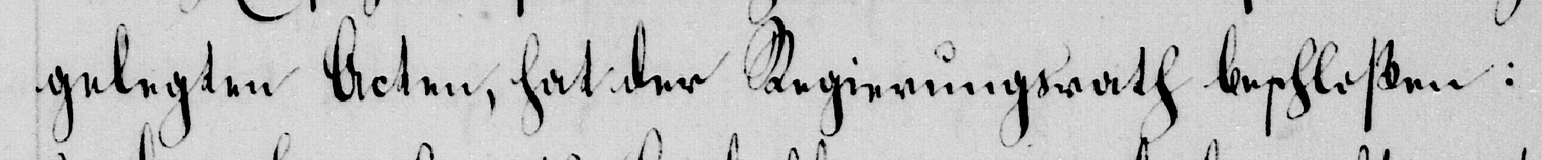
gelegten Acten, hat der Regierungsrath beschloßen:
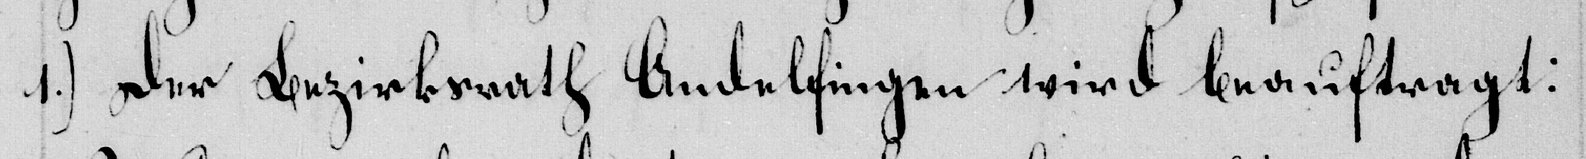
1.) Der Bezirksrath Andelfingen wird beauftragt:
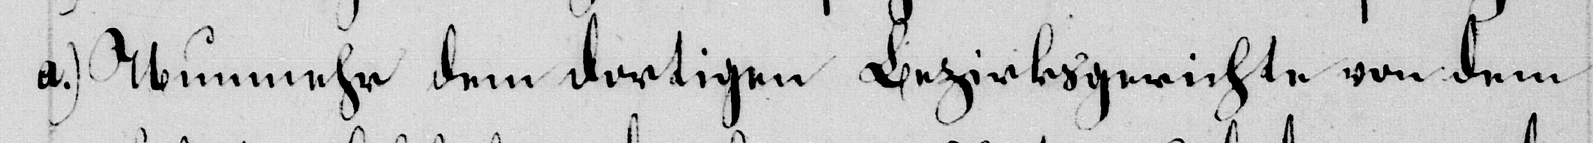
a.) Nunmehr dem dortigen Bezirksgerichte von dem
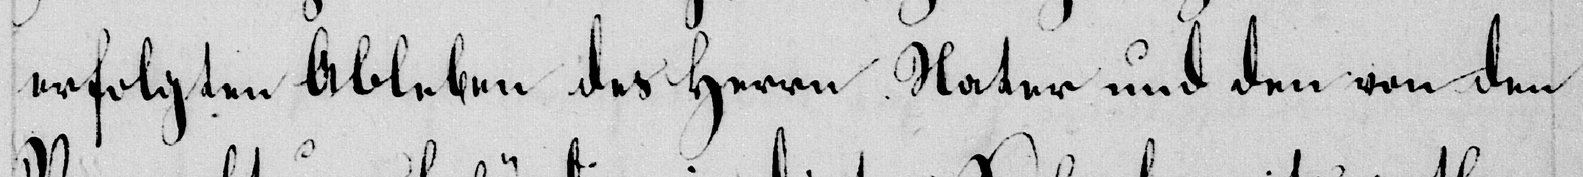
erfolgten Ableben des Herrn Nater und den von den
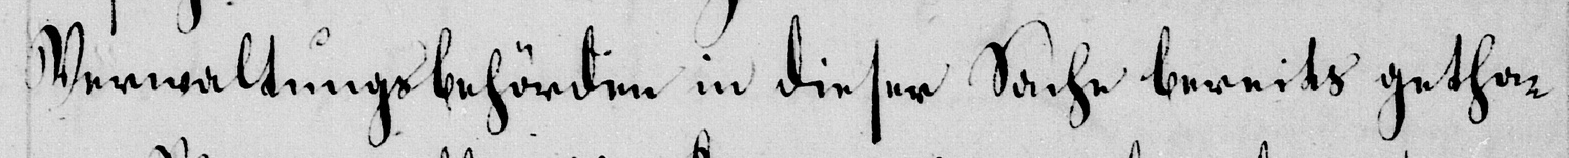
Verwaltungsbehörden in dieser Sache bereits getha¬
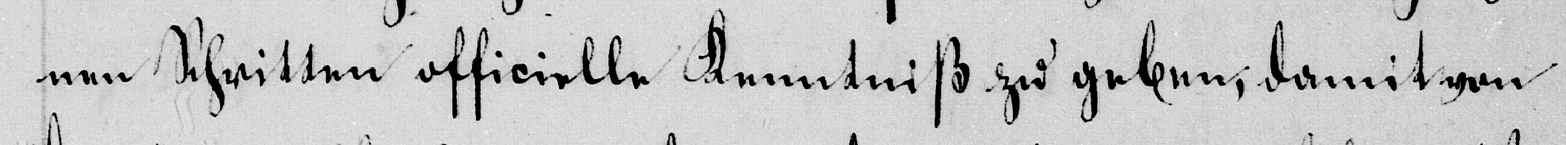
nen Schritte officielle Kenntniß zu geben, damit von
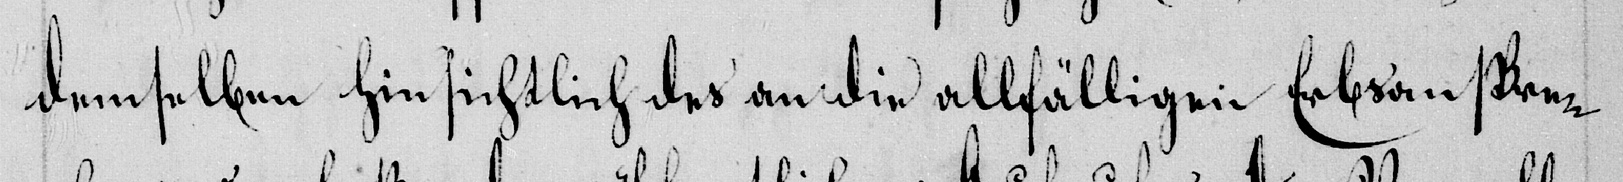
demselben hinsichtlich des an die allfälligen Erbsanspre¬
